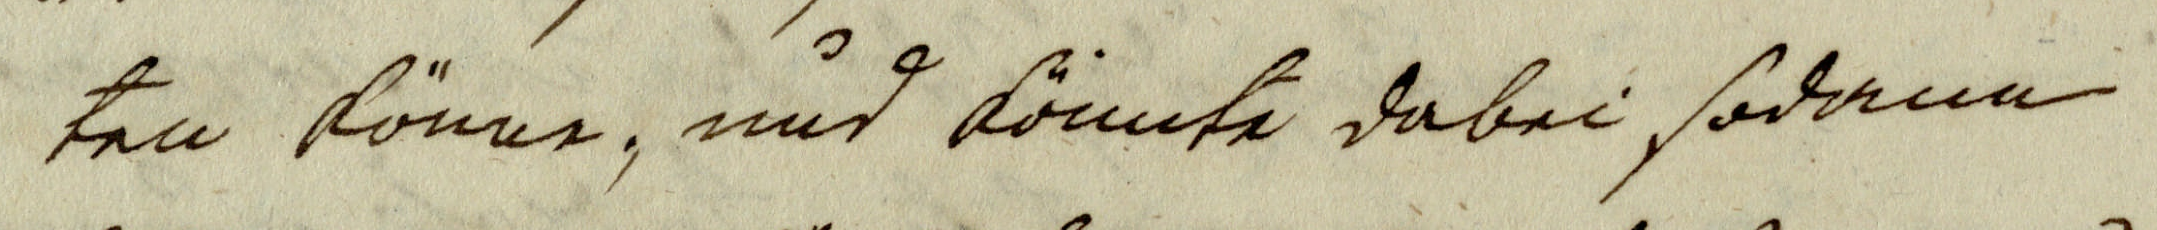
ten könne; und könnte dabei sodann
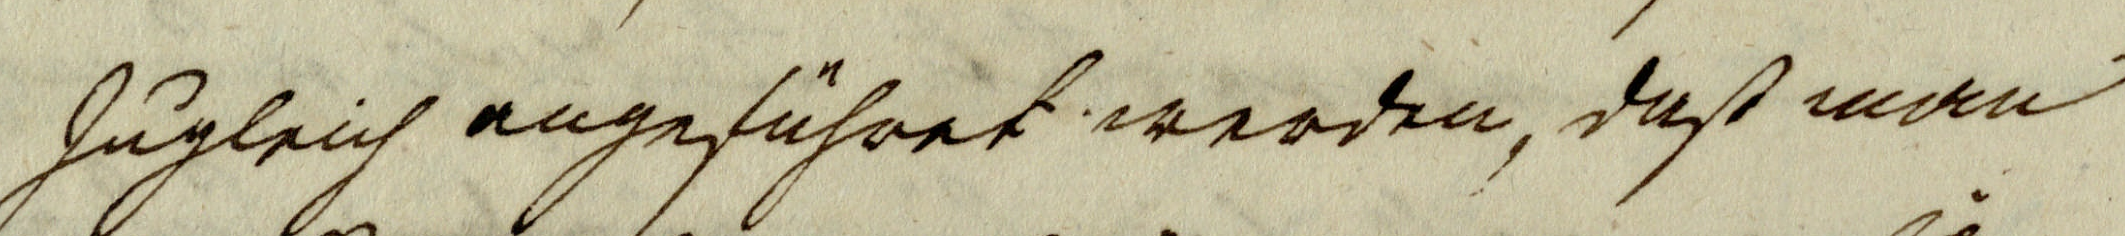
zugleich angeführet werden, daß man
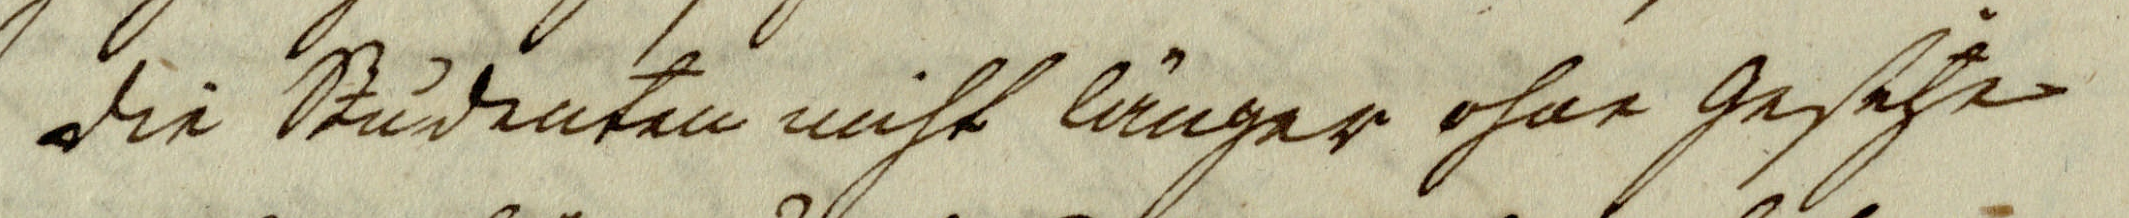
die Studenten nicht länger ohne Gesetze
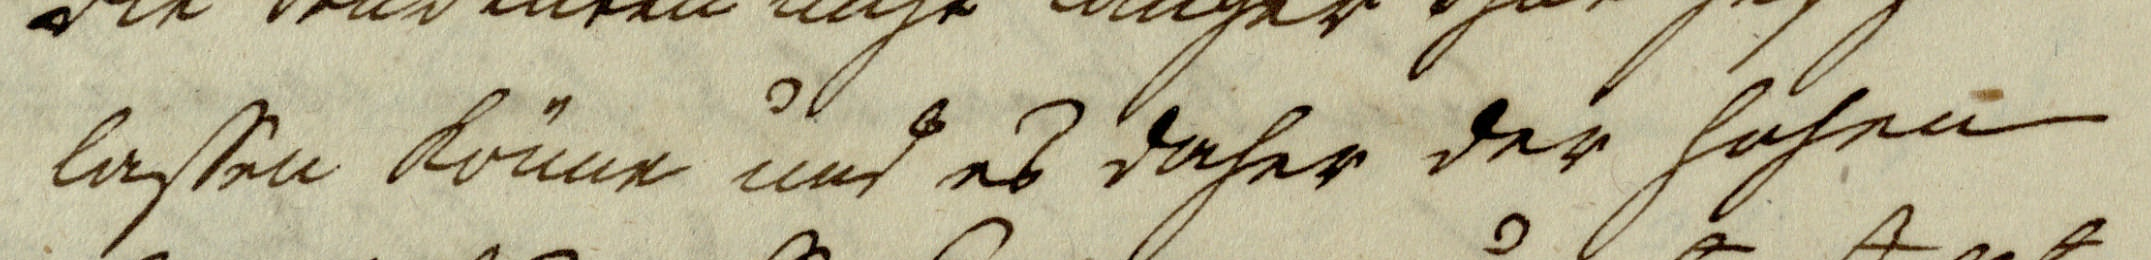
lassen könne und es daher der hohen
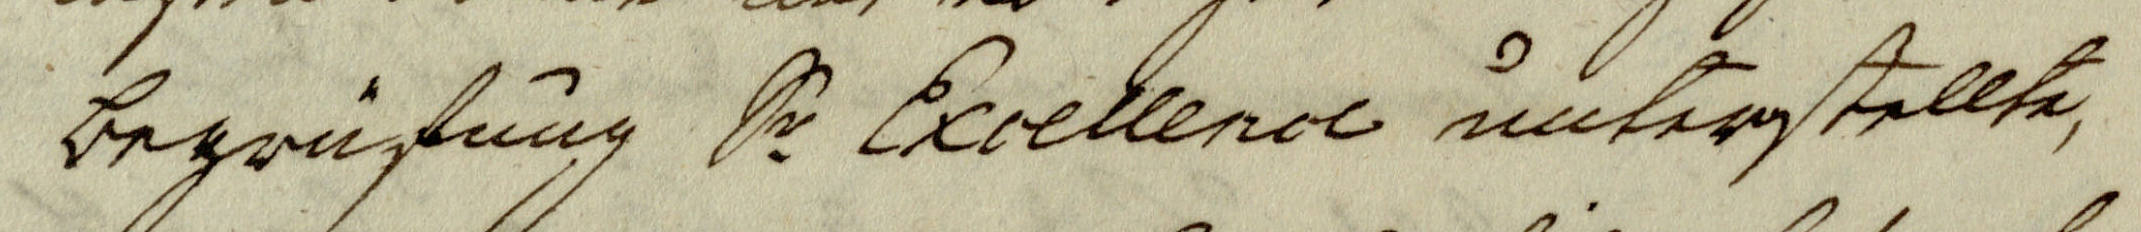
Beprüfung Sr. Excellence unterstellte,
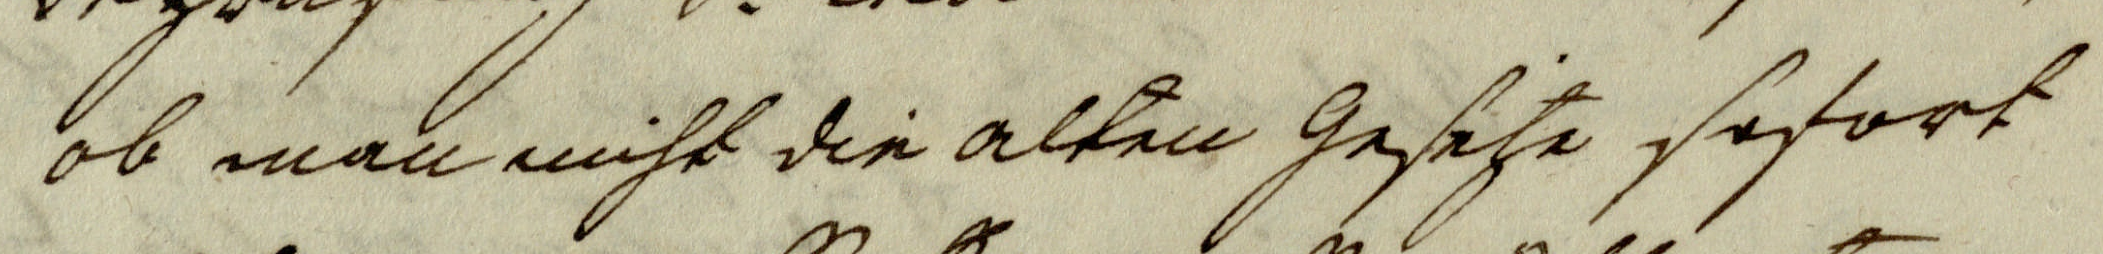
ob man nicht die alten Gesetze sofort
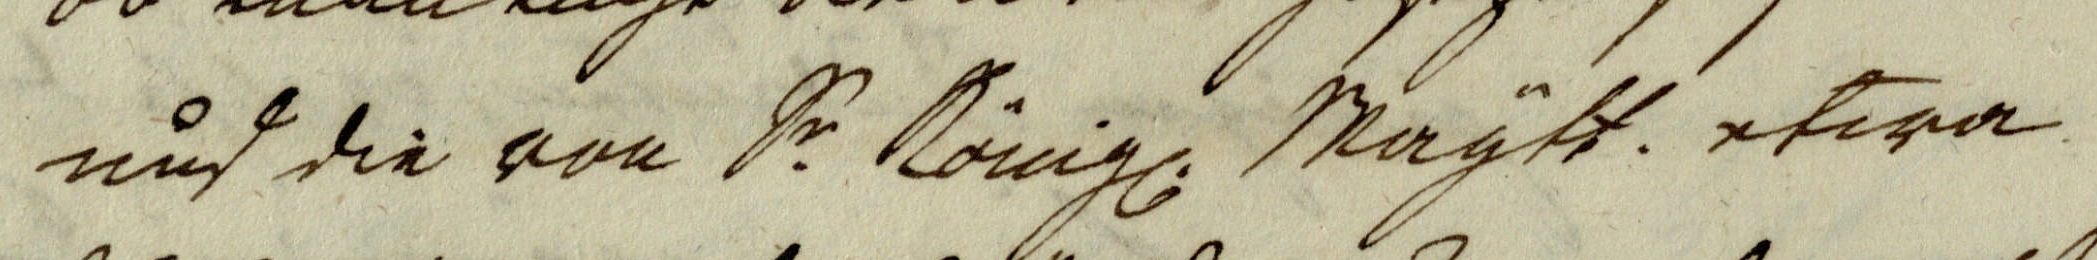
und die von Sr. Königl. Maÿst. etwa
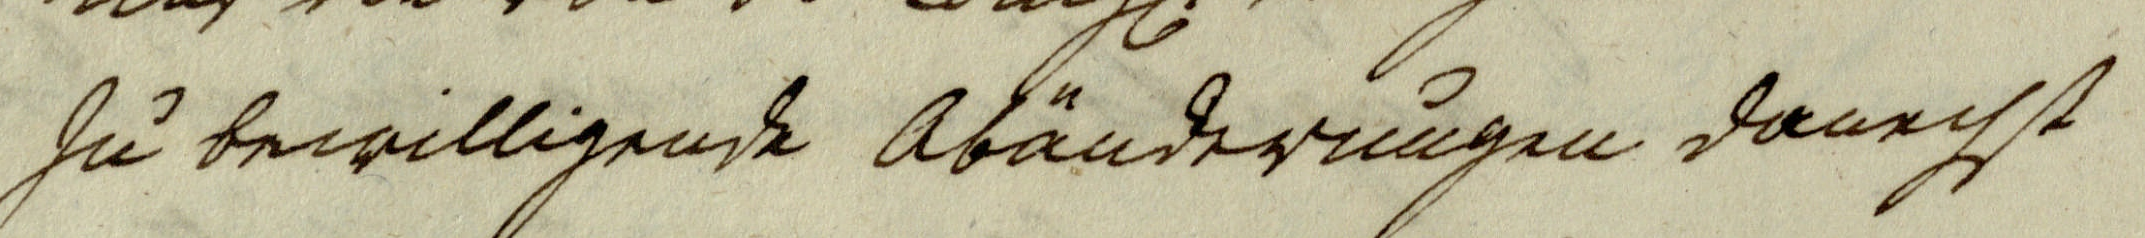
zu bewilligende Abänderungen danechst
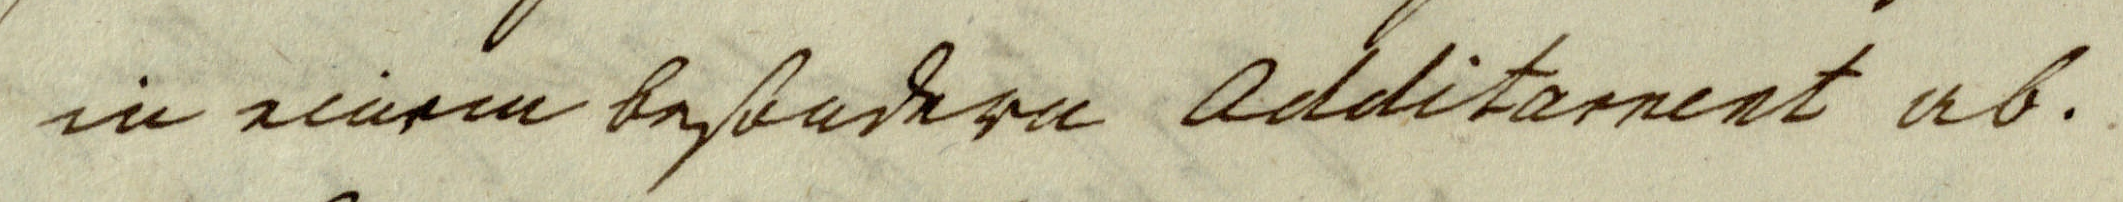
in einem besonderen Additament ab¬
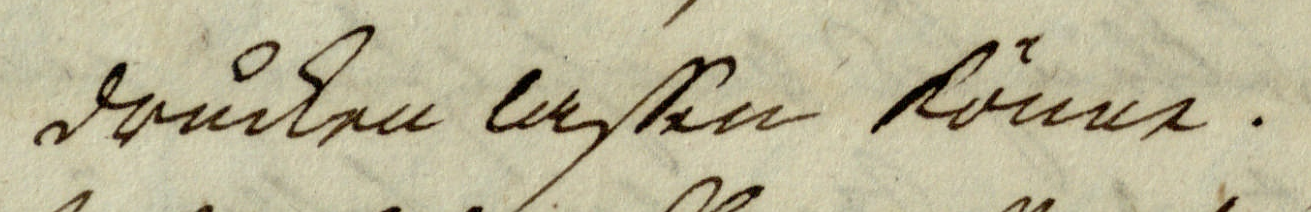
drucken lassen könne.
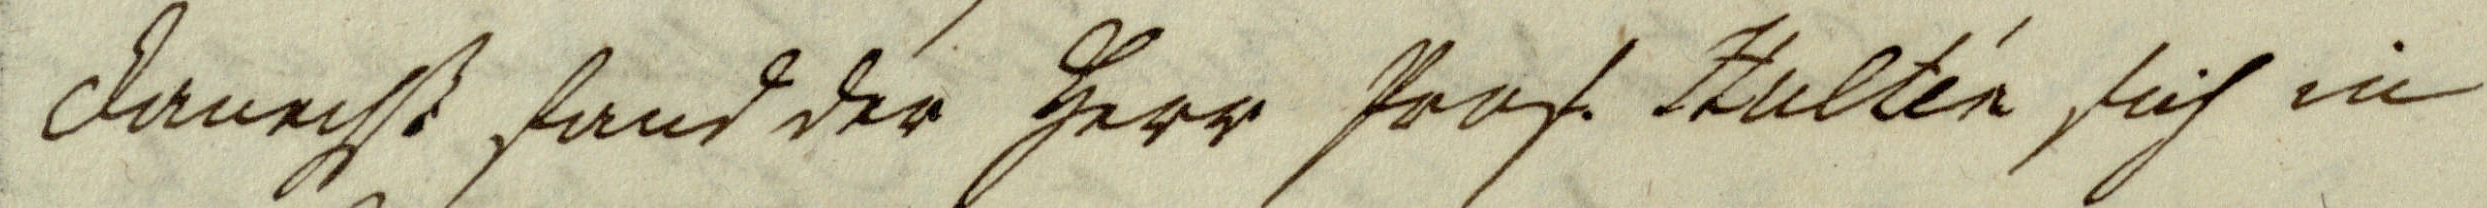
Danechst fand der Herr Prof. Hultén sich in
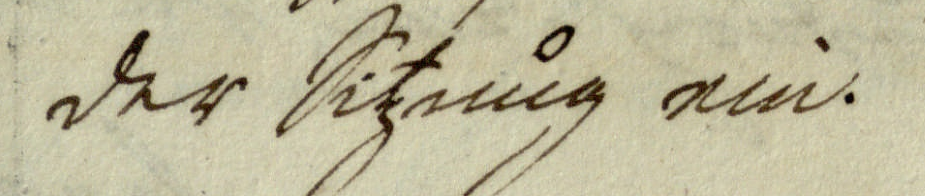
der Sitzung ein.
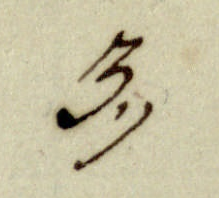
3.,
